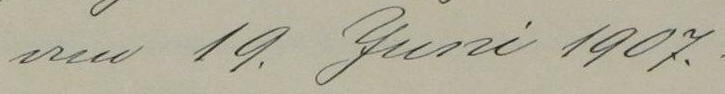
am 19. Juni 1907.
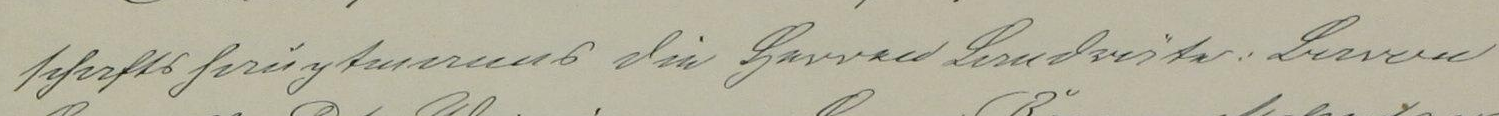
schaftshauptmanns die Herren Landräte: Baron
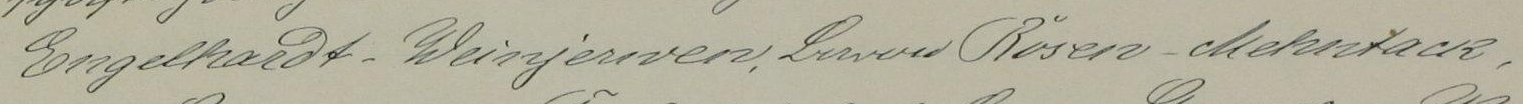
Engelhardt-Weinjerwen, Baron Rosen-Mehntack,
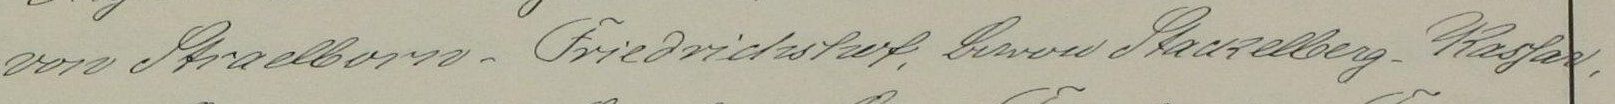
von Straelborn-Friedrichshof, Baron Stackelberg-Kassar,
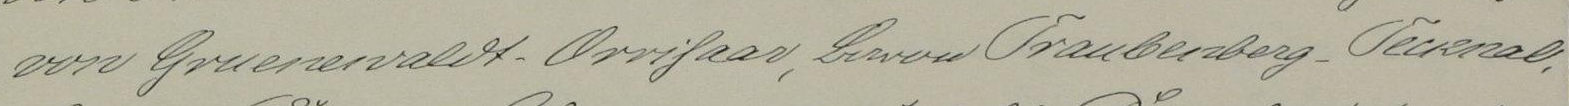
von Gruenewaldt-Orrisaar, Baron Traubenberg-Tecknal,
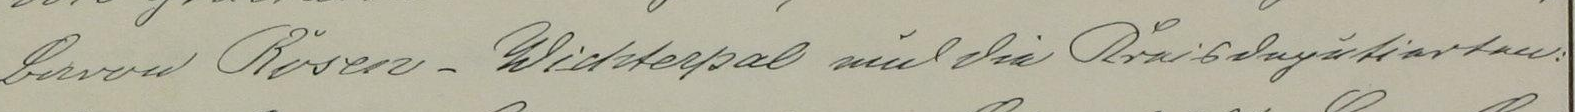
Baron Rosen-Wichterpal und die Kreisdeputierten:
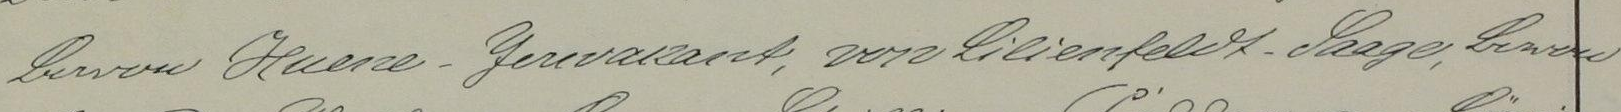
Baron Huene-Jerwakant, von Lilienfeldt-Saage, Baron
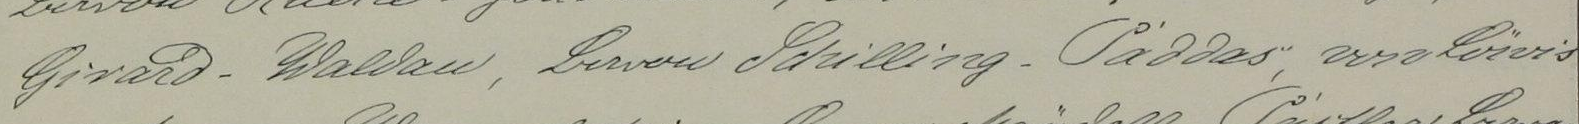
Girard-Waldau, Baron Schilling-Paddas, von Löwis
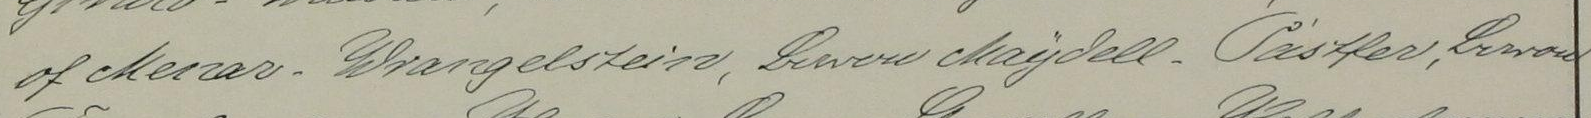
of Menar-Wrangelstein, Baron Maydell-Pastfer, Baron
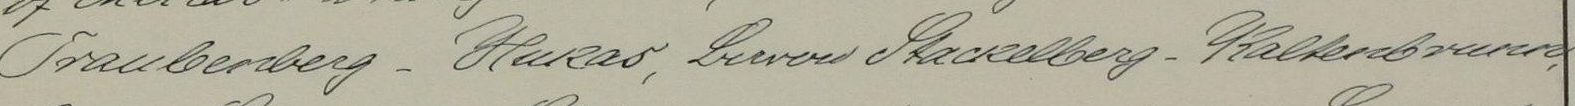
Traubenberg-Hukas, Baron Stackelberg-Kaltenbrunn,
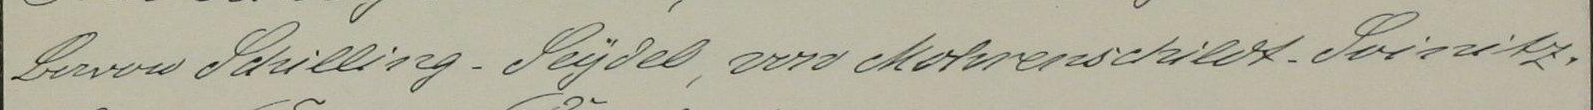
Baron Schilling-Seydel, von Mohrenschildt-Soinitz,
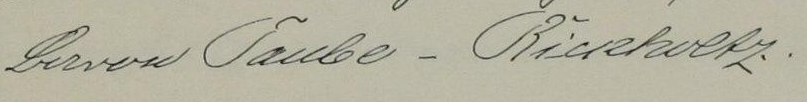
Baron Taube-Rickholtz.
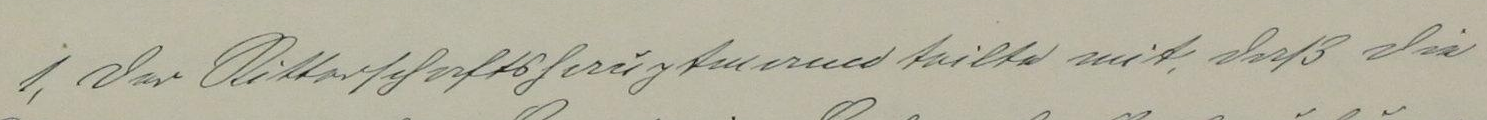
1. Der Ritterschaftshauptmann teilte mit, daß die
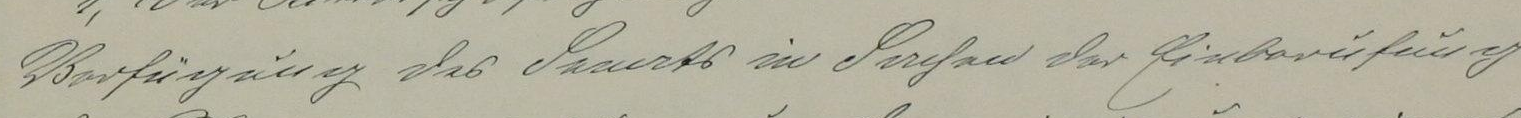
Verfügung des Senats in Sachen der Einberufung
